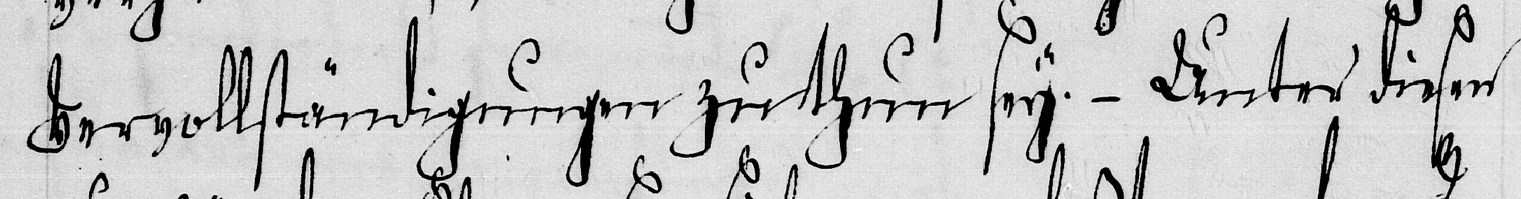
Vervollständigungen zuthun sey. – Unter diesen
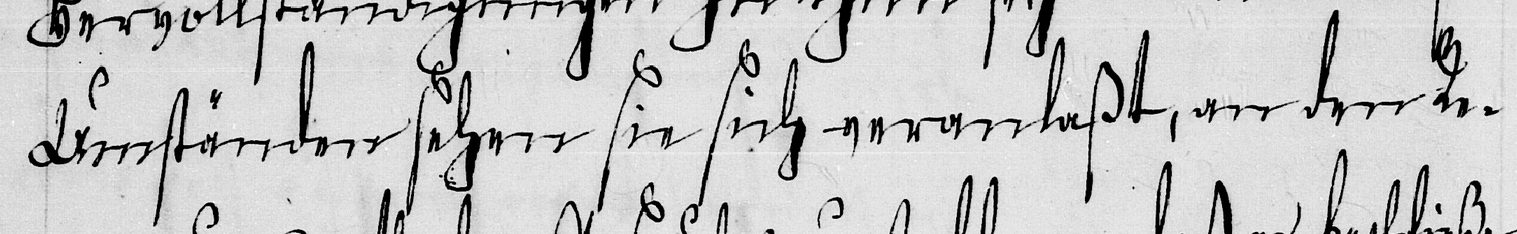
Umständen sehen sie sich veranlaßt, an den Re¬
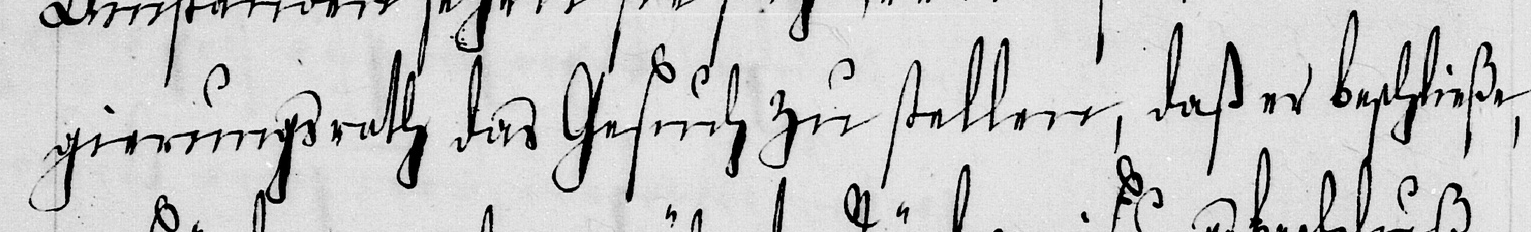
gierungsrath das Gesuch zu stellen, daß er beschließ¬
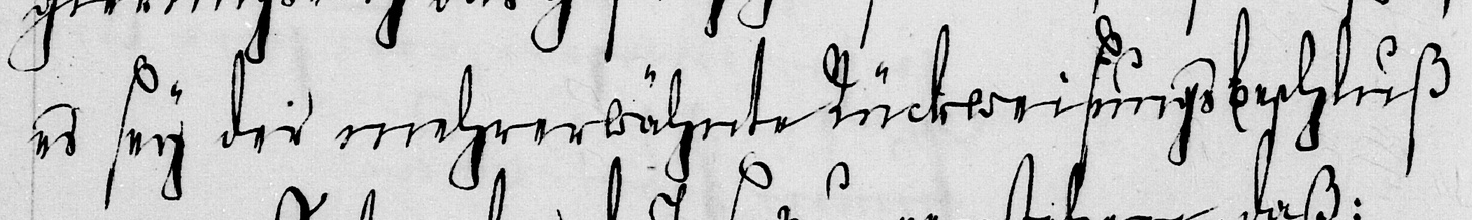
es sey der mehrerwähnte Rückweisungsbeschluß
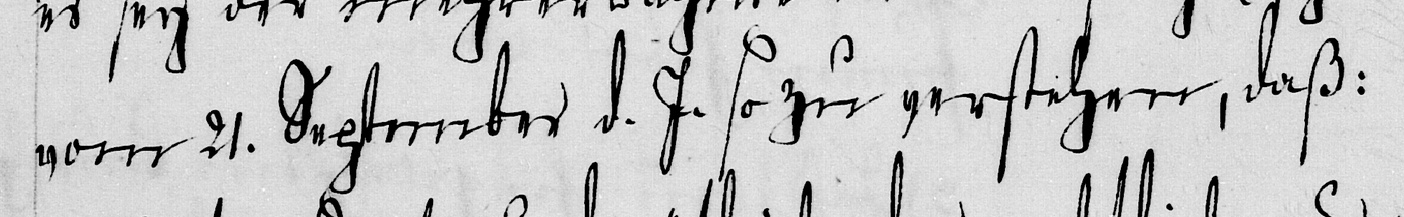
vom 21. September d. J. so zu verstehen, daß:
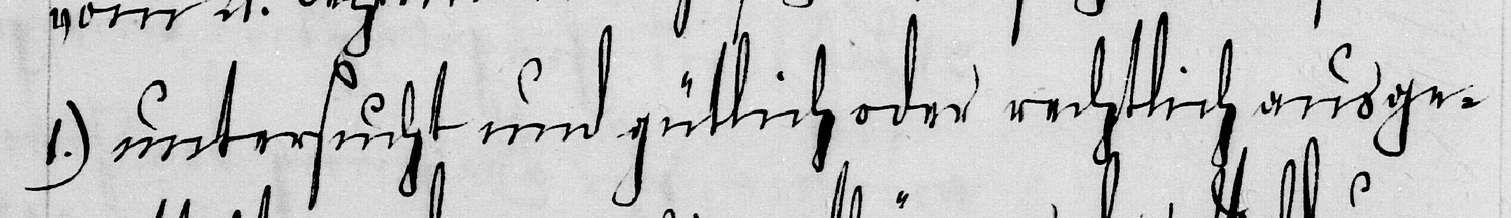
1.) untersucht und gütlich oder rechtlich ausge¬
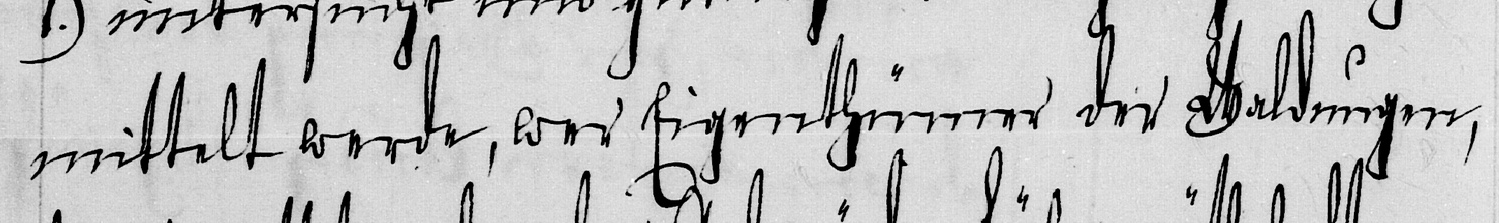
mittelt werde, wer Eigenthümer der Waldungen,
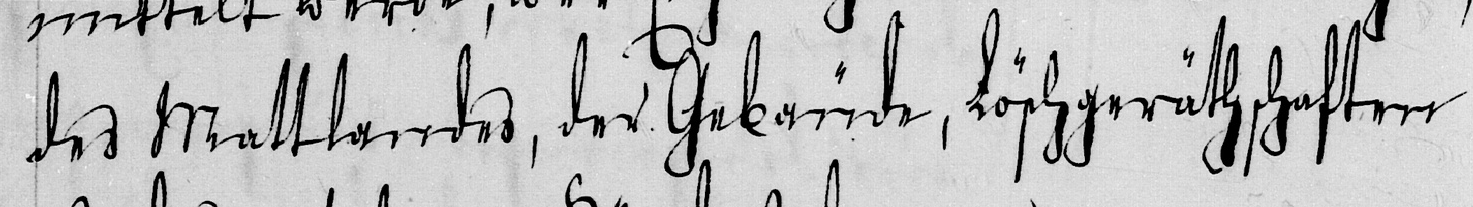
des Mattlandes, der Gebäude, Löschgeräthschaften
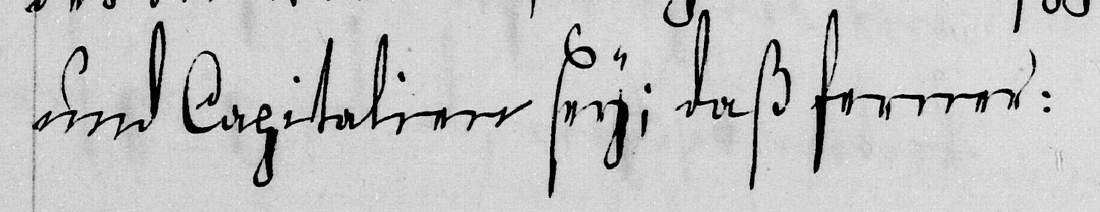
und Capitalien sey; daß ferner:
